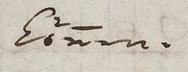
können.
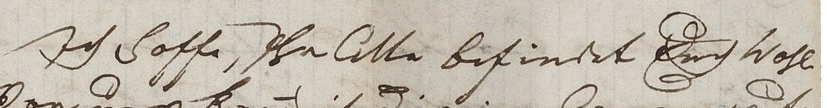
Ich hoffe, Ihr Alle befindet Euch wohl.
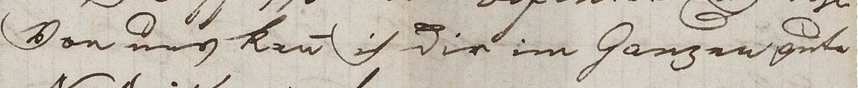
Von uns kann ich dir im Ganzen gute
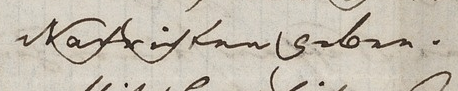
Nachrichten geben.
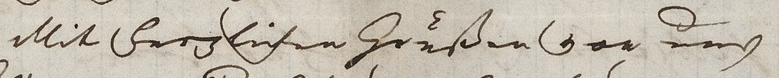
Mit herzlichen Grüßen von uns
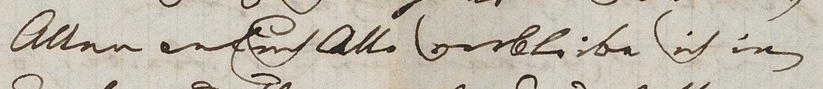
Allen an Euch Alle verbleibe ich in
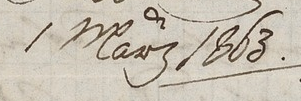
1. März 1863.
